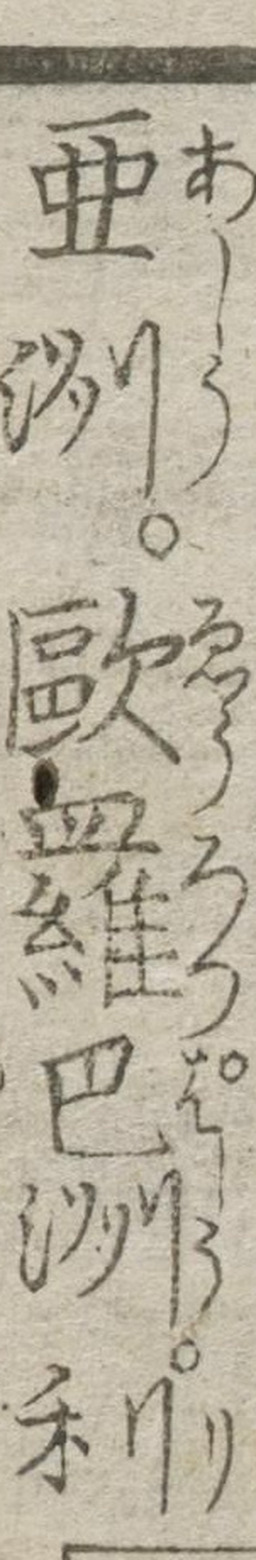亜洲。欧羅巴洲。利
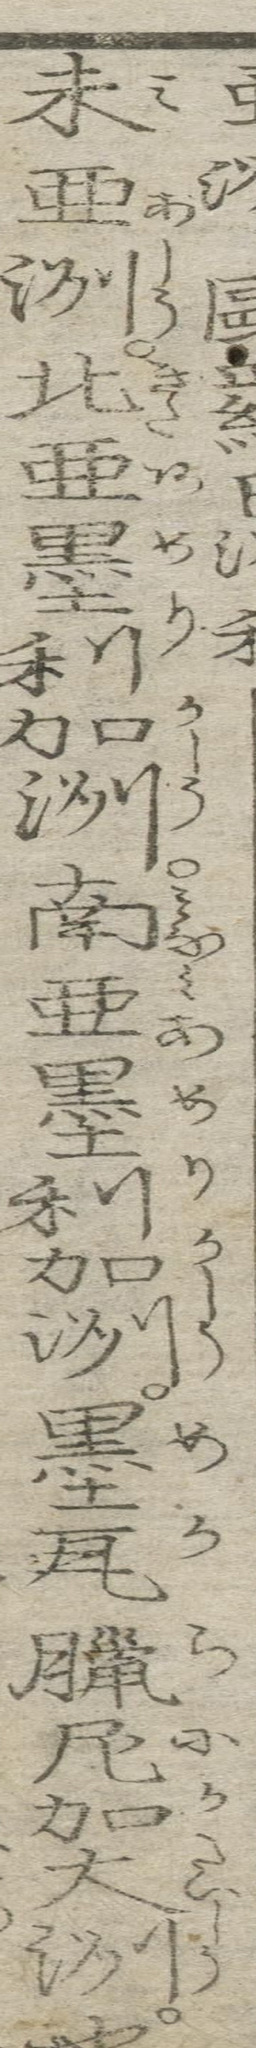未亜洲。北亜墨利加洲。南亜墨利加洲。墨瓦臘尼加大洲。也
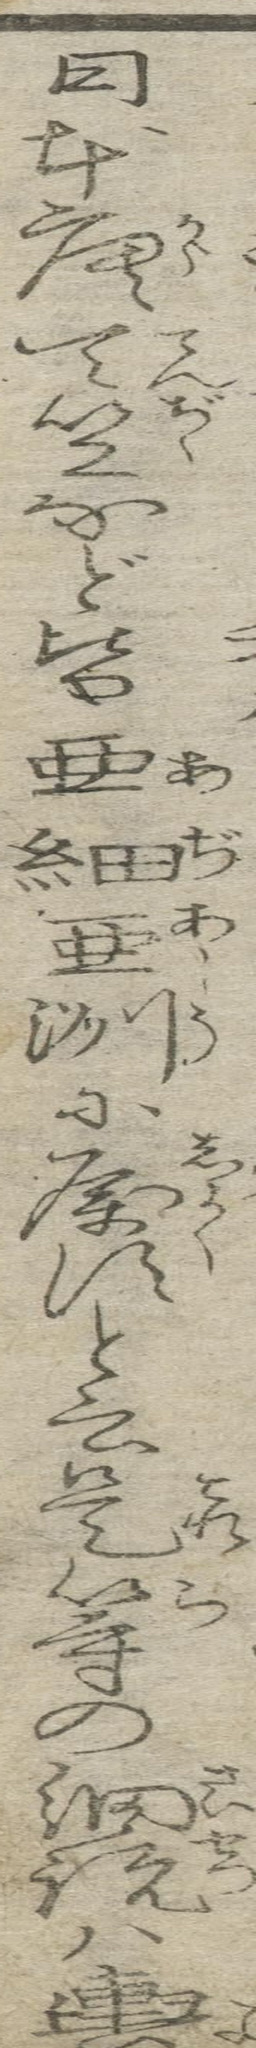日本唐天竺など皆亜細亜洲に属すと云是等の細説は輿

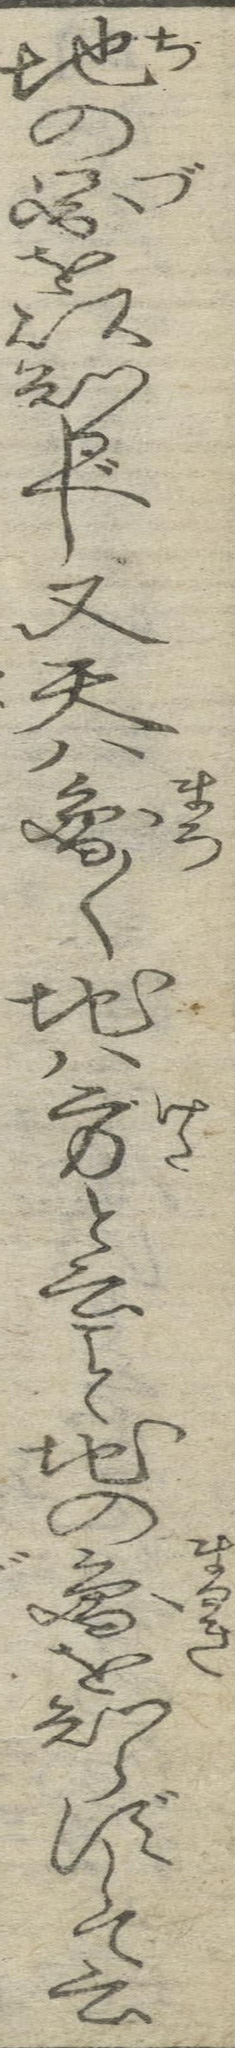地の図を以知るべし又天は円く方と云こと地の円を知らずして云
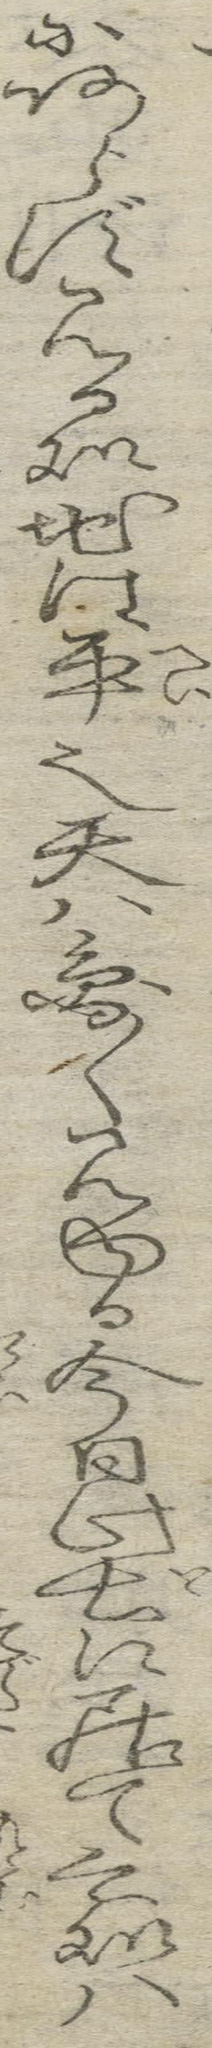にあらず見る処地は平也天は円く見ゆる今日此土に居て云処は
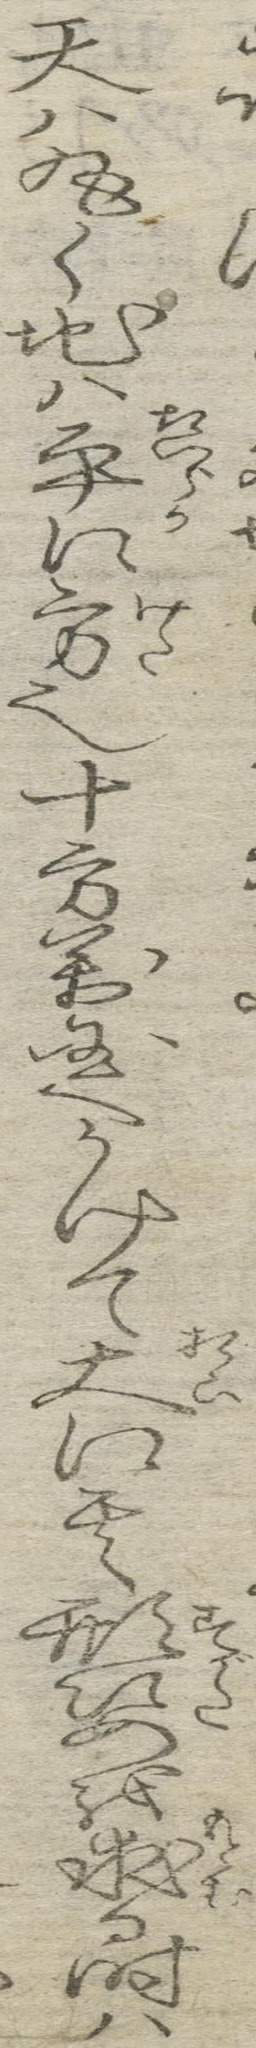天は丸く地は平に方十方万国へかけて大に其形姿を求る時は
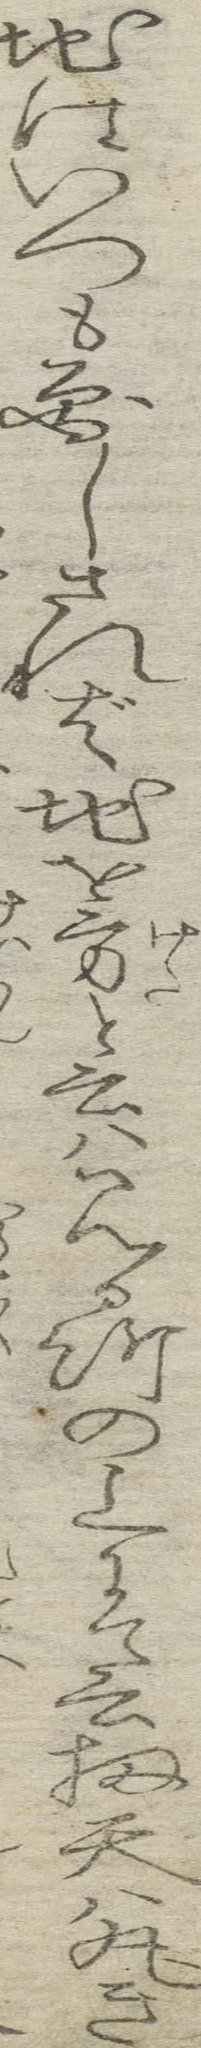地はいつも円しされば地を方と云は見る所の上にて云扨天は丸き
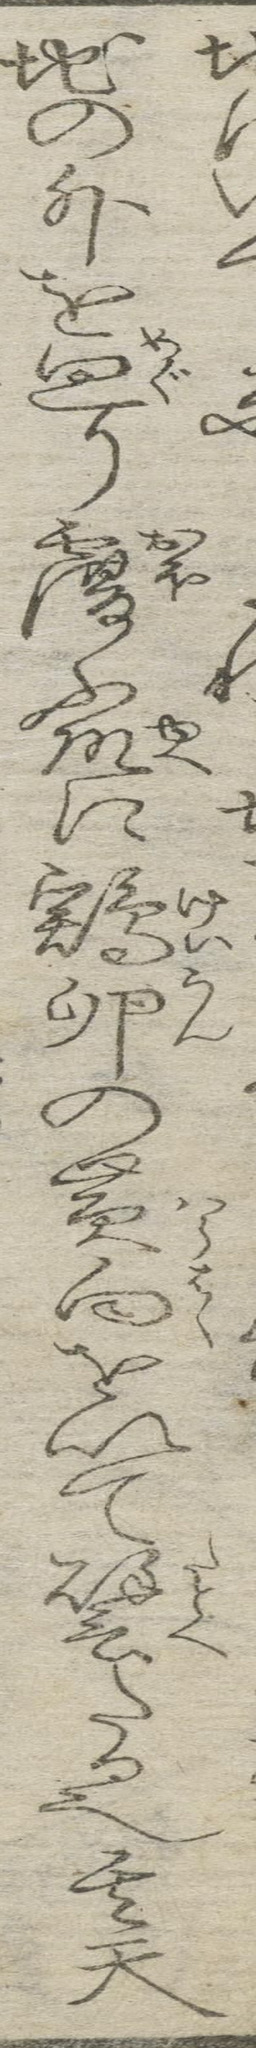地の外を廻り覆ふ故に鶏卵の黄白を以て譬たる也其天
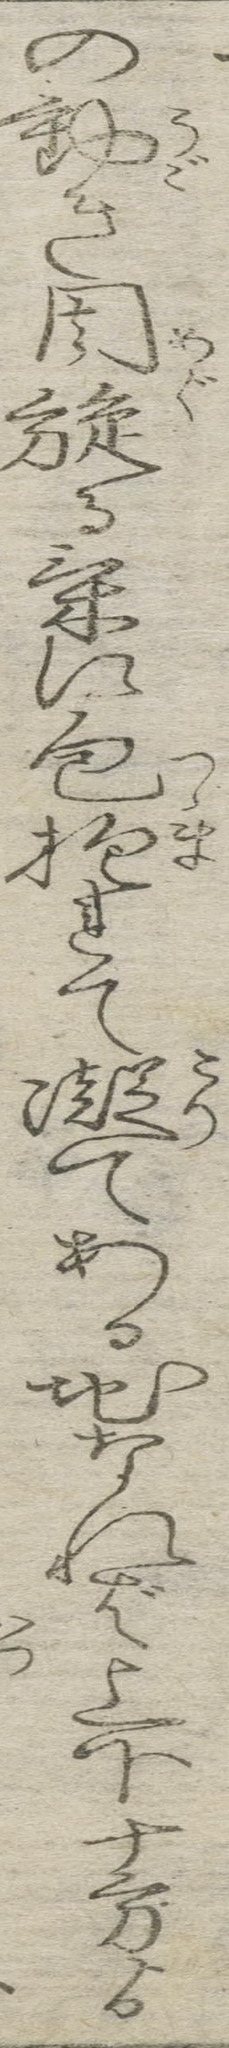の動き周旋る気に包抱れて凝ある地なれば上下十方ゟ
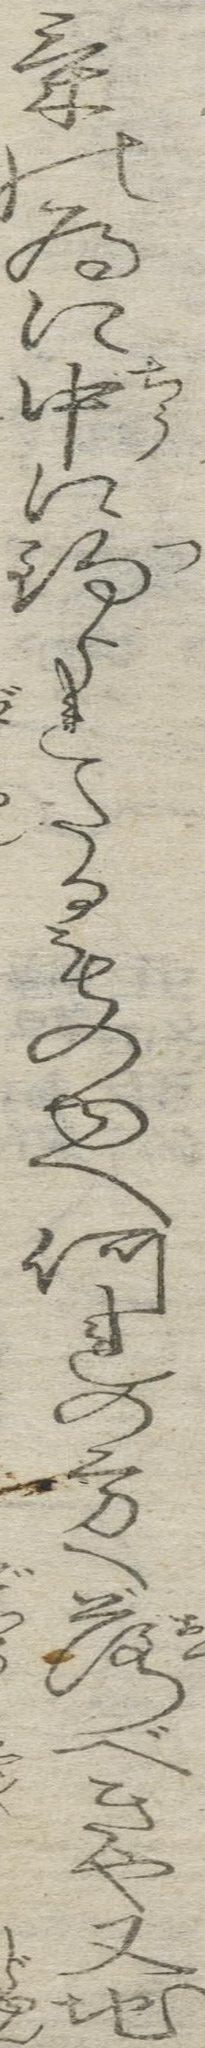気の為に中に釣られたるものゆへ何れの方へ落べきや又地
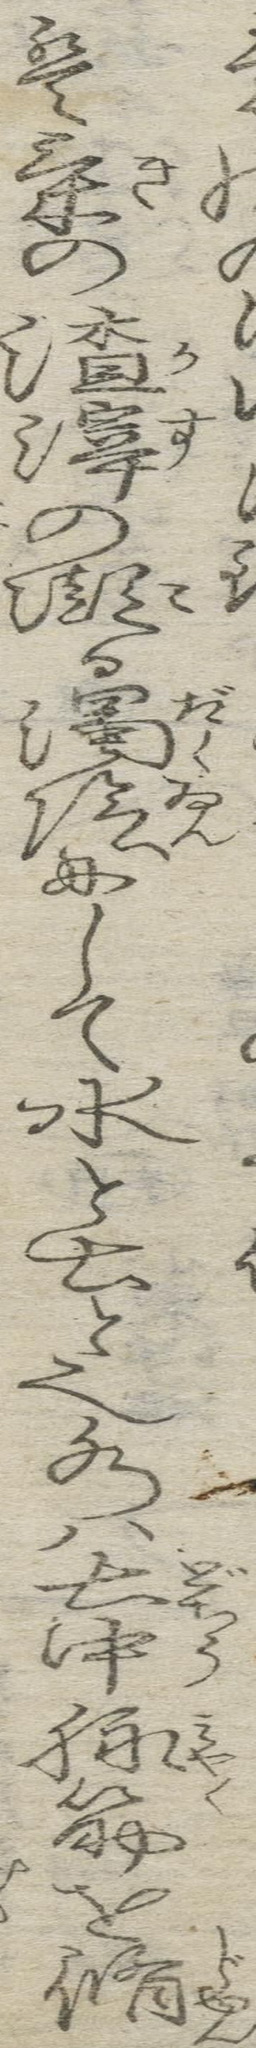は気の渣滓の凝る濁陰にして水と土と也水は土中脈筋を循
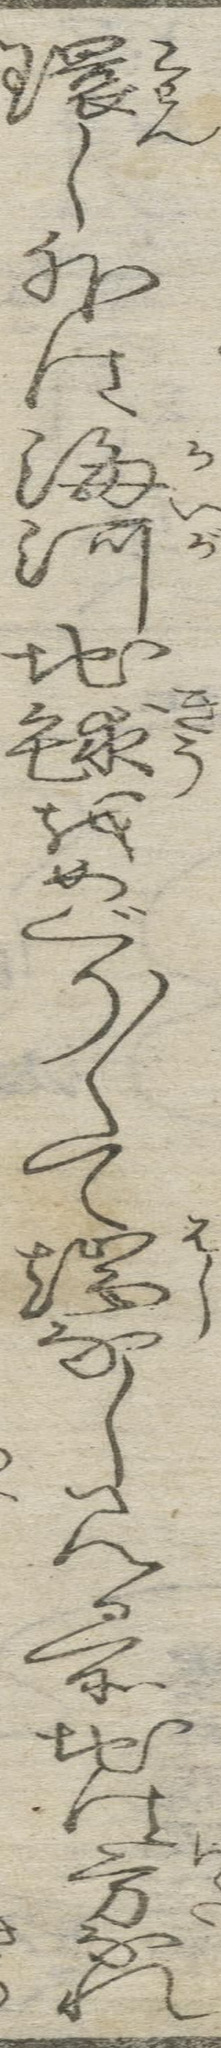環し外は海河地毬をめぐり〳〵て端なし見る所地は方なれ
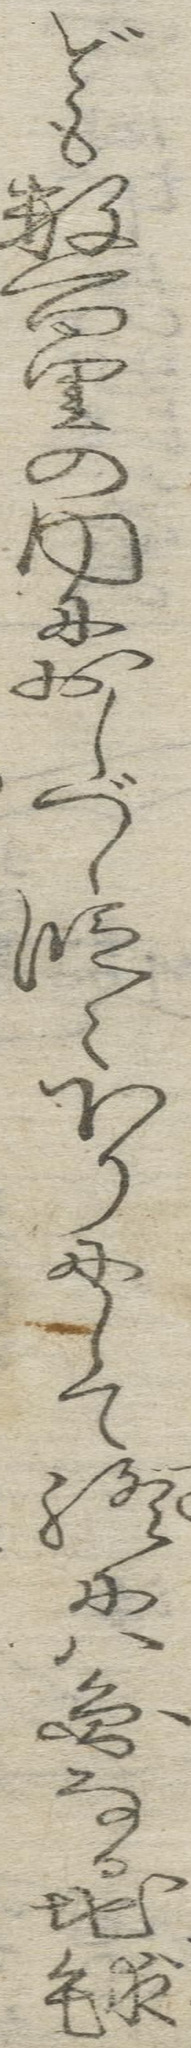ども数百里の内に少しづゝ段々下りにして終には円なる地毬
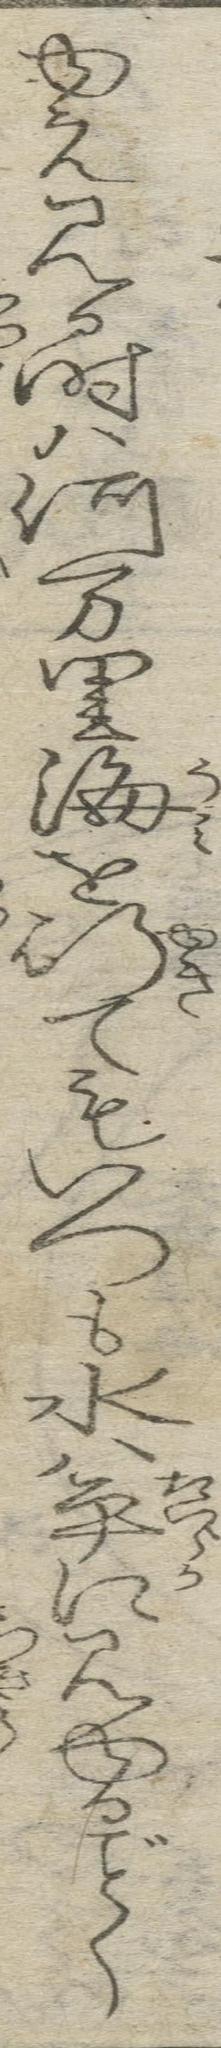ゆえ見る時は何万里海を行てもいつも水は平にみゆるごとく
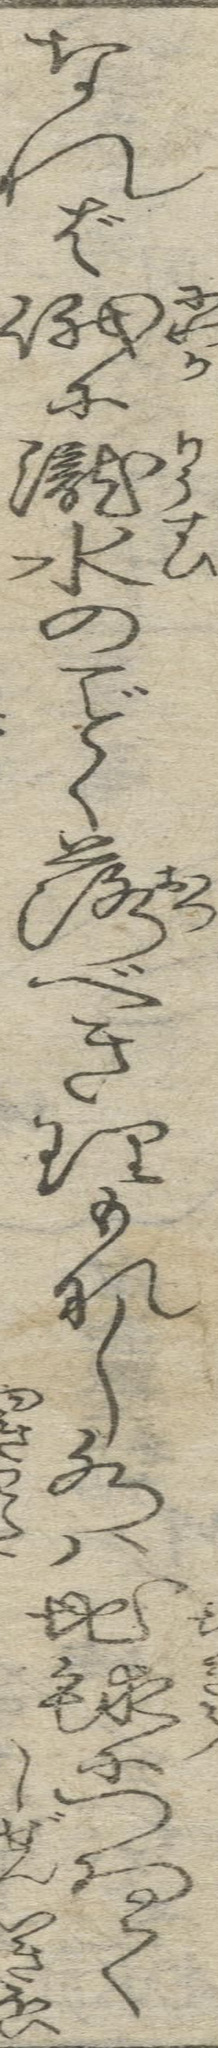なれば俄に瀧水のごとく落べき理もなし水は地毬につくく
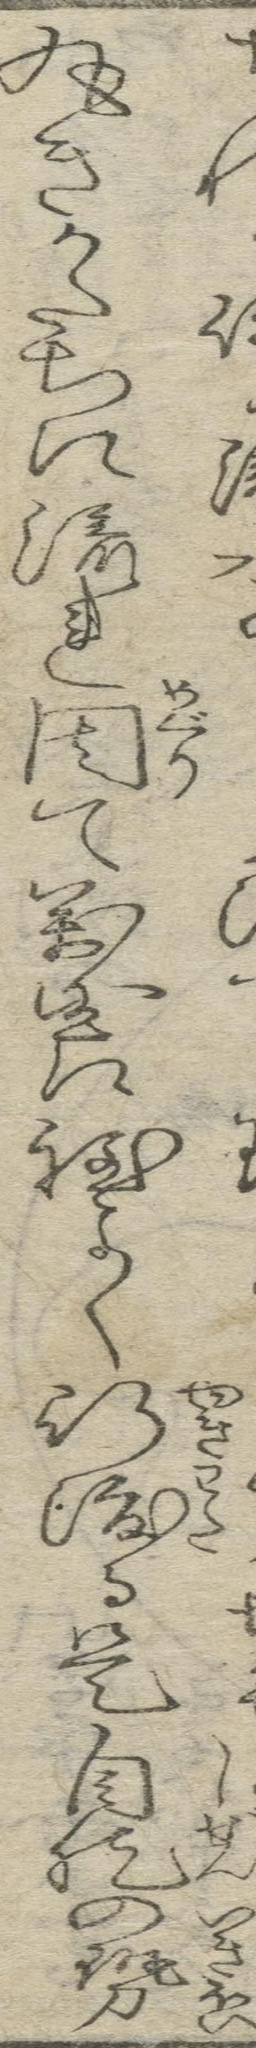丸きかたちに流れ周て万国に程よく行渡る是自然の勢
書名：訓蒙天地辨　天
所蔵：東京大学地震研究所図書室 Earthquake Research Institute Library, The University of Tokyo, JAPAN
